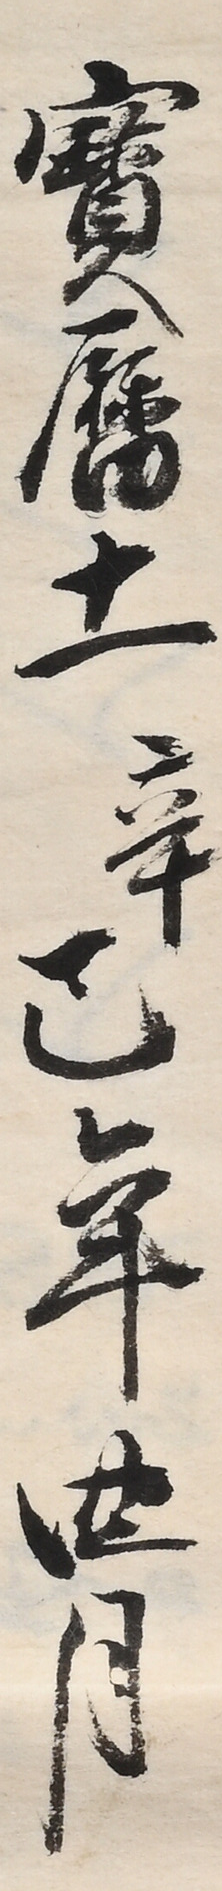宝暦十一辛巳年四月
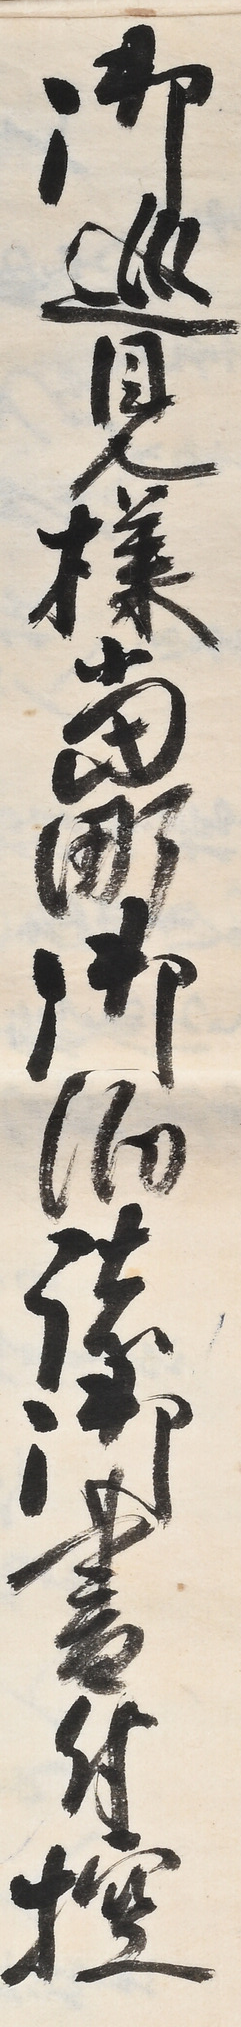御巡見様当町御泊諸御書付控
